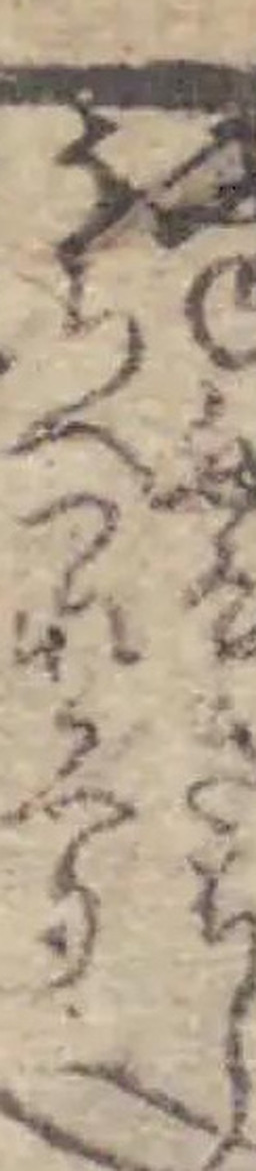うつへつれかへり
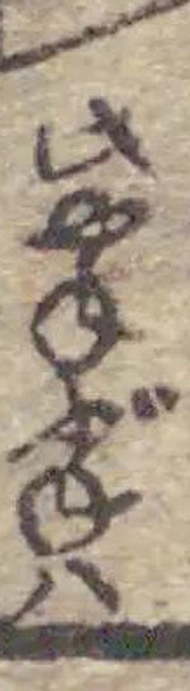此やねぶねは
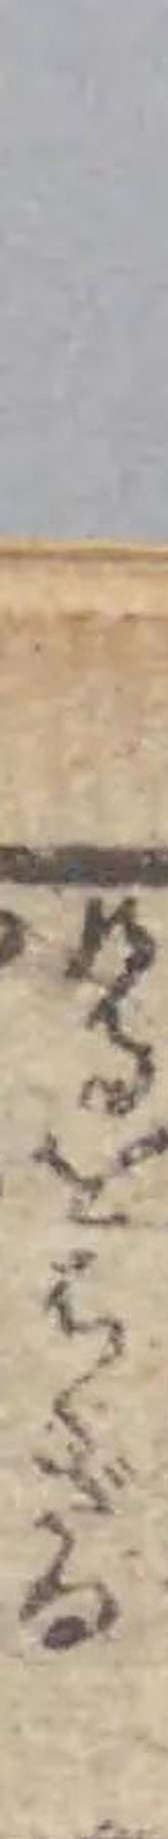けるをはゝざる
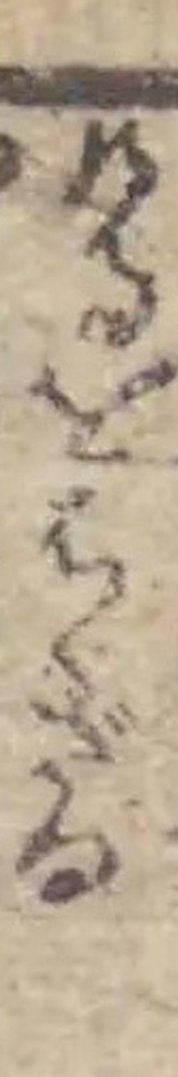けるをはゝざる
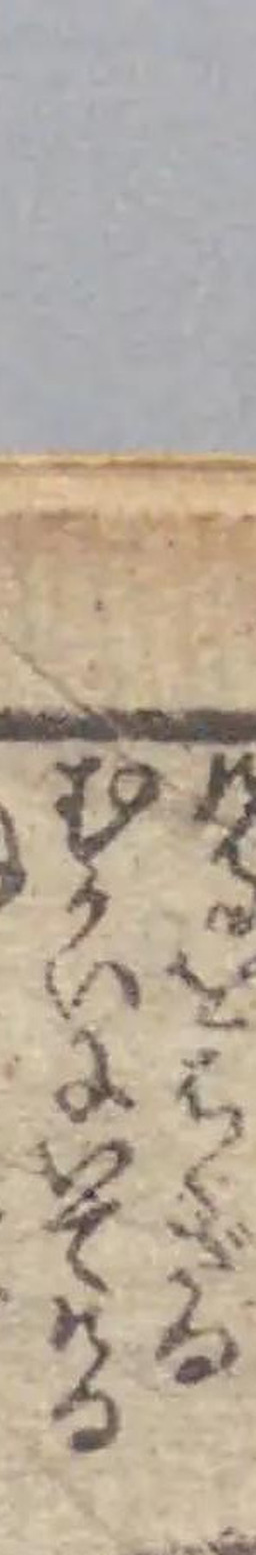むかいにいてける
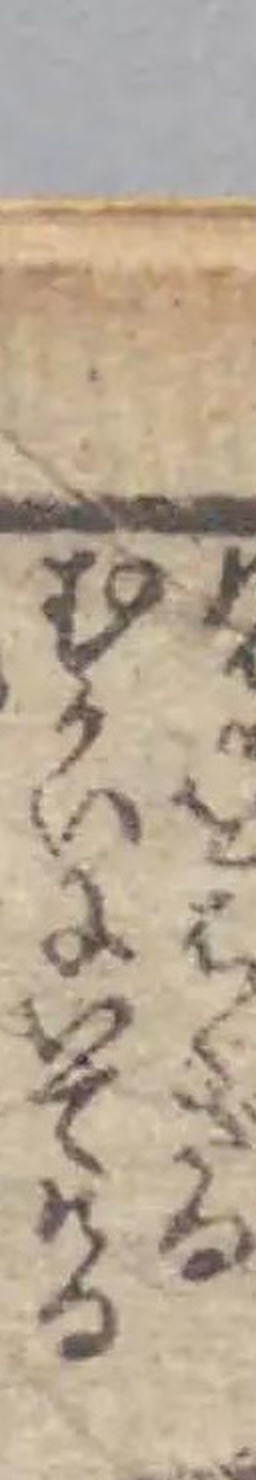むかいにいてける
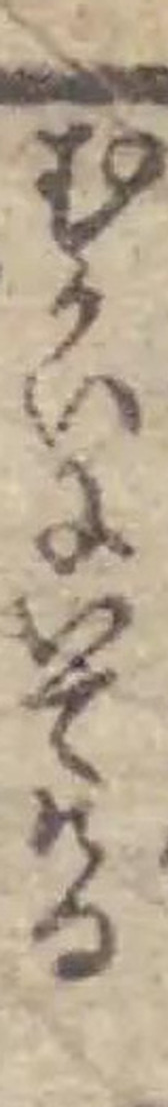むかいにいてける
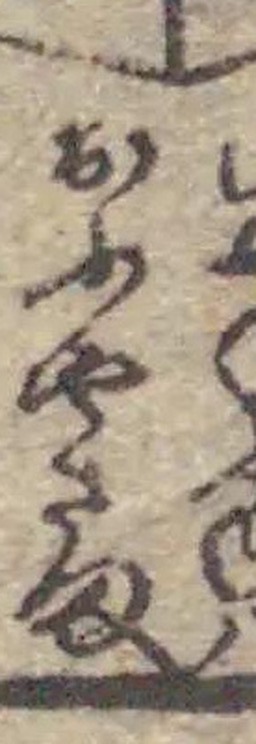おふやさま
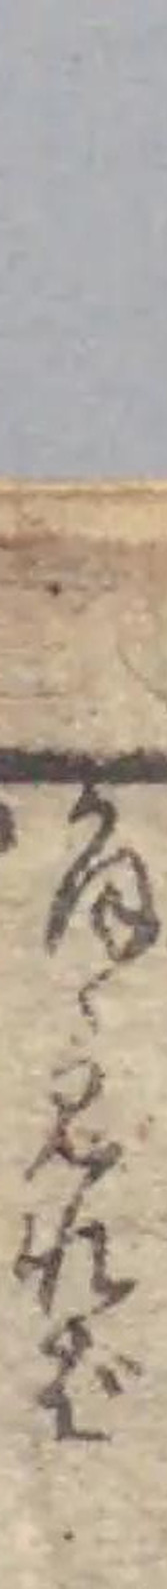かほゝ見れば
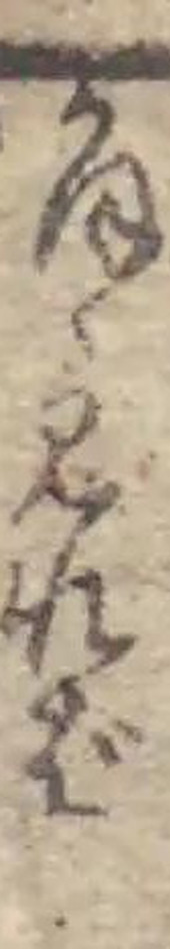かほゝ見れば
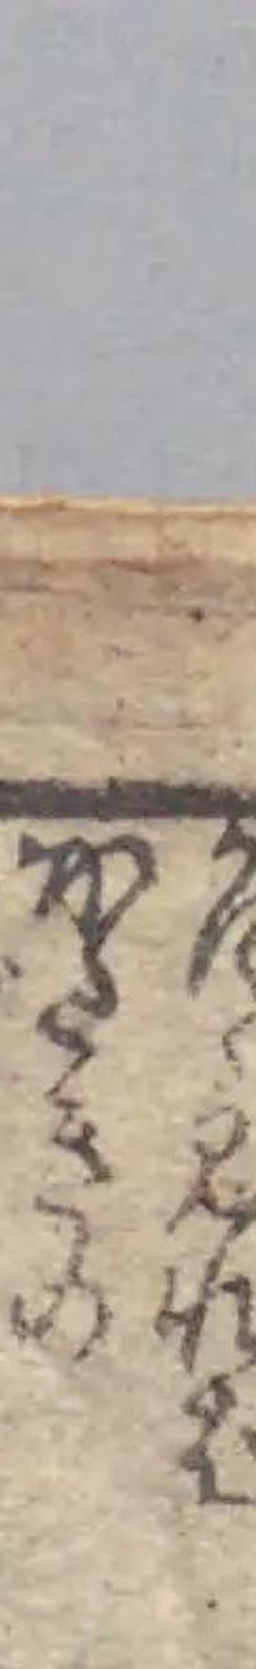かたきの
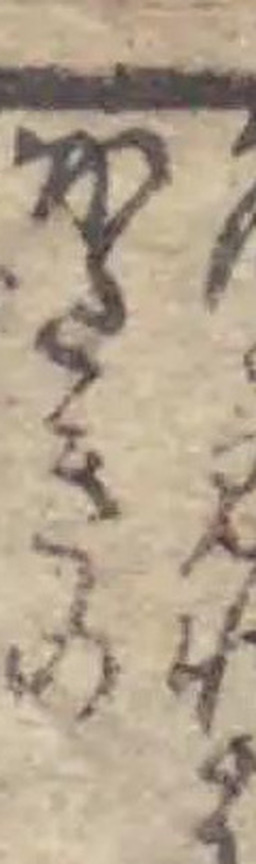かたきの
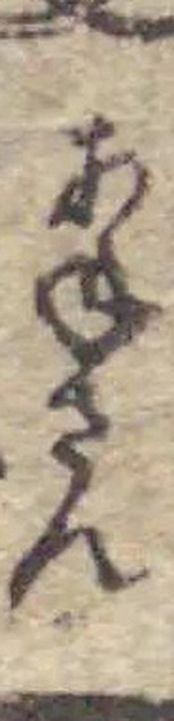あねさん
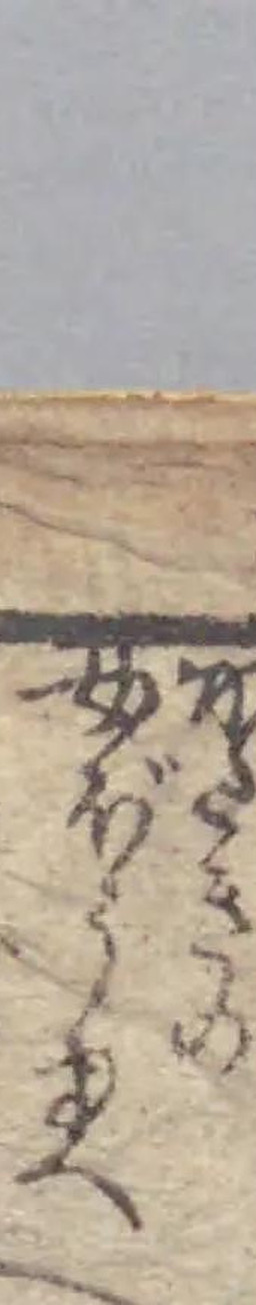女ぼうゆへ
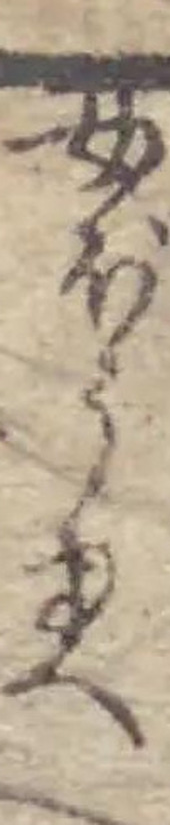女ぼうゆへ
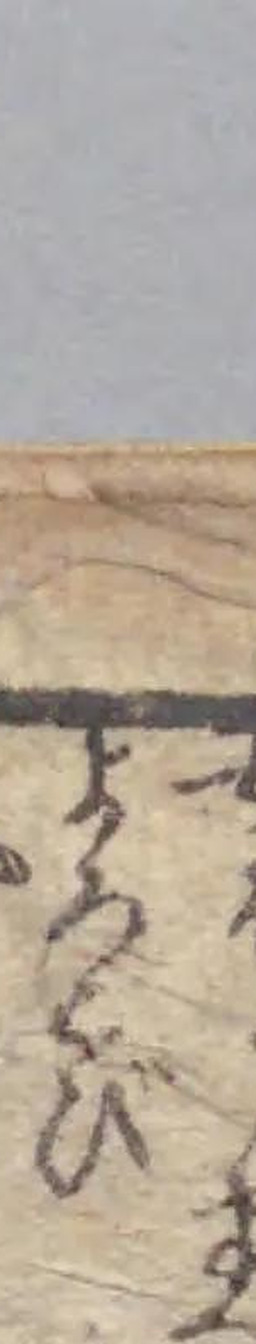よろこび
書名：蟹牛房挟多 3巻
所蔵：国立国会図書館 National Diet Library, JAPAN
